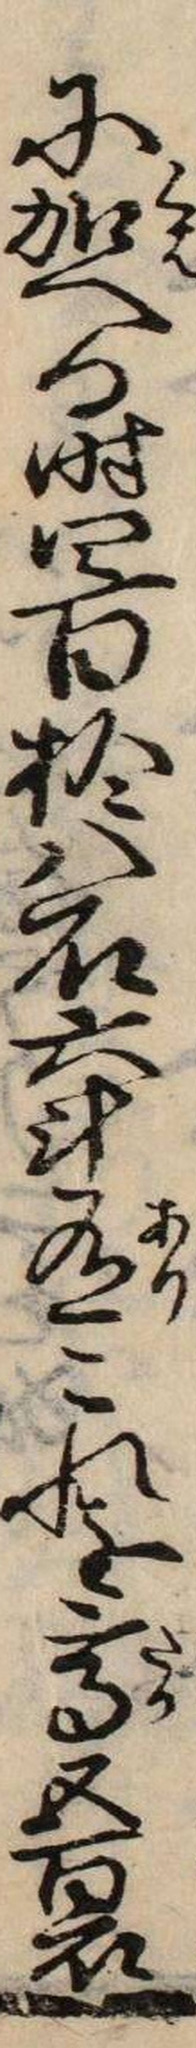に加へる時四百拾八石六斗有これを高五百石
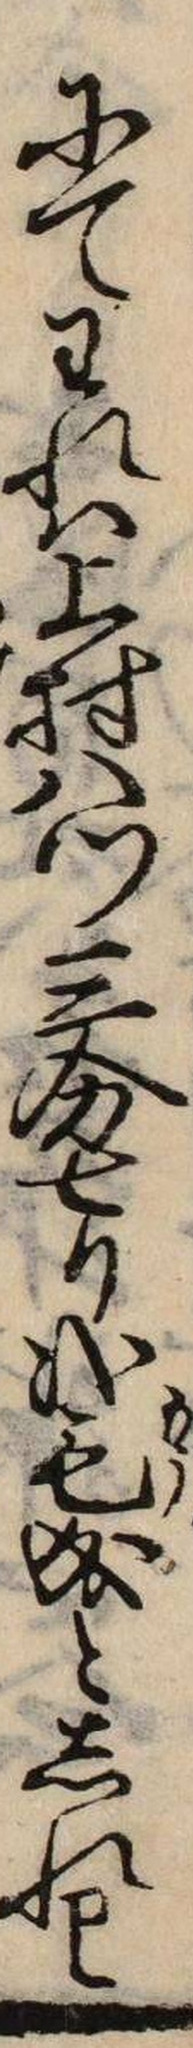にてわれは上村八つ三分七り弐毛成としれ申候
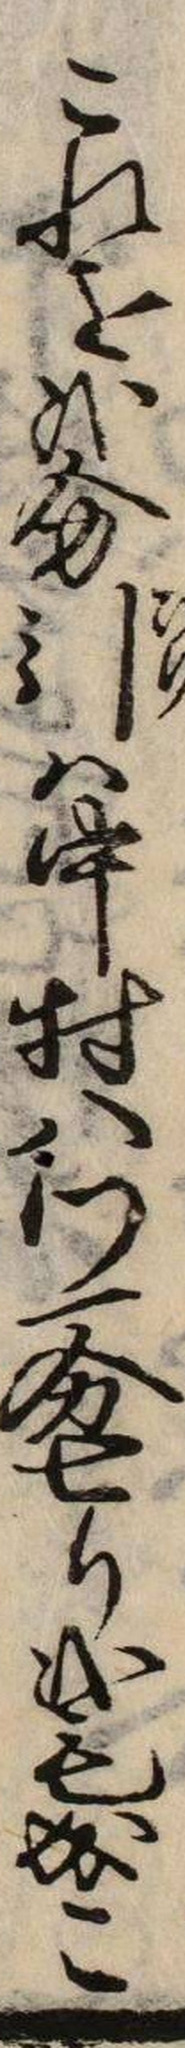これを弐分引は中村八つ一分七り弐毛成こ
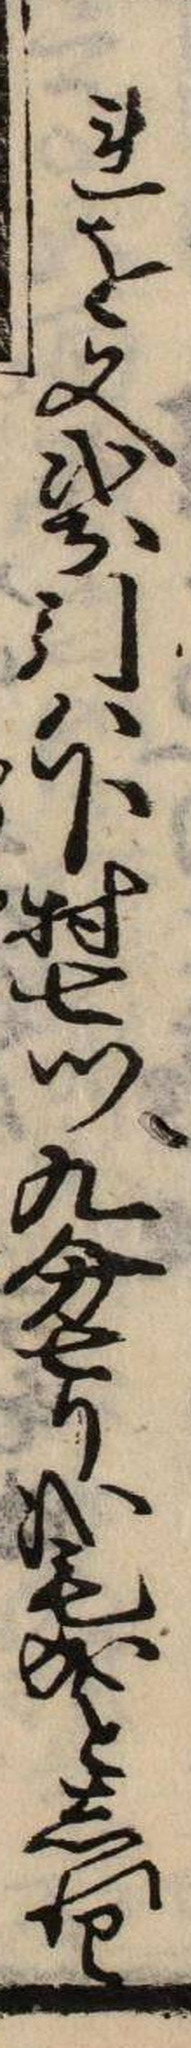れを又弐分引は下村七つ九分七り弐毛成としれ申候
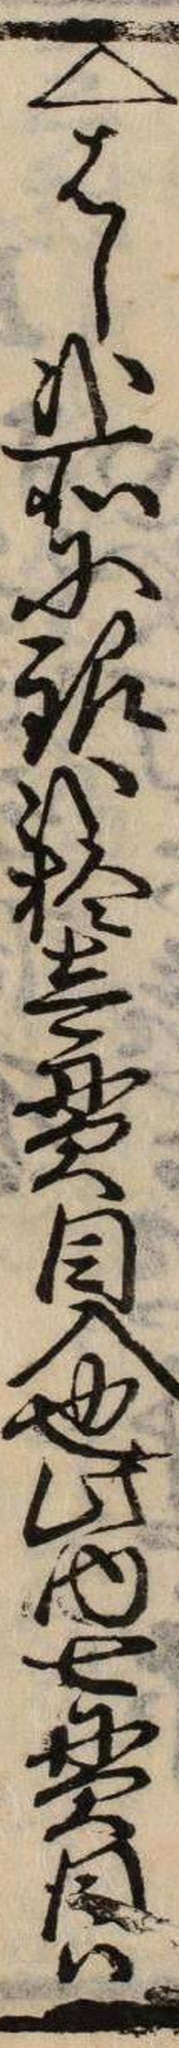△はし弐所に銀弐拾壱貫目入也此内七貫目は
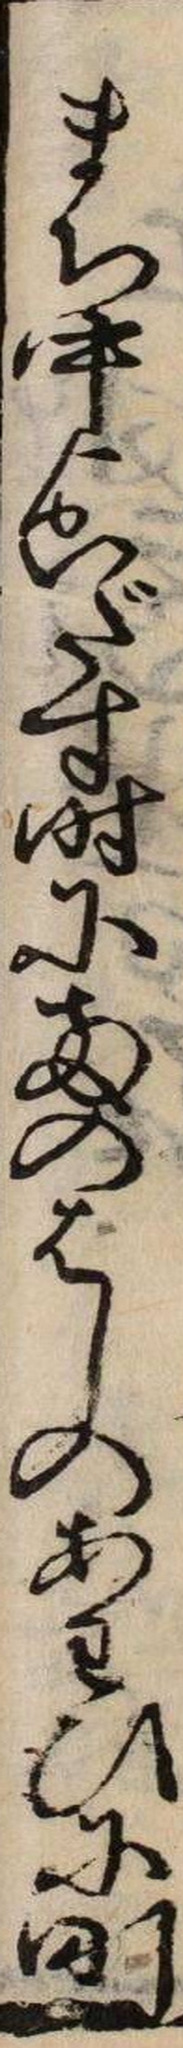まち中ゟいだす時に両のはしのあわひに町
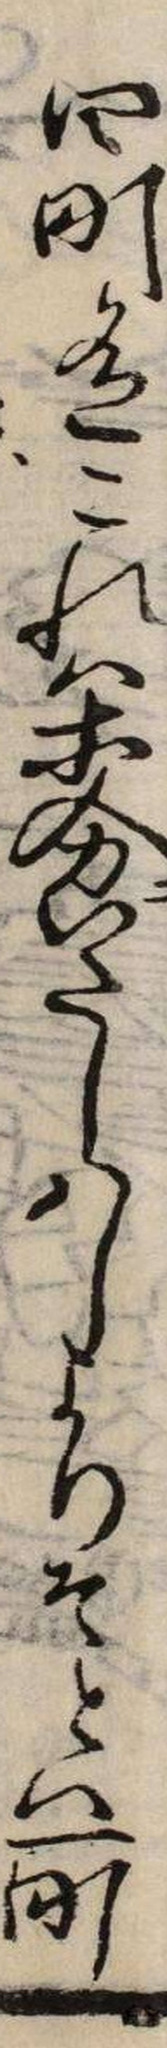四町有これは等分にいたしはしよりそとは一町
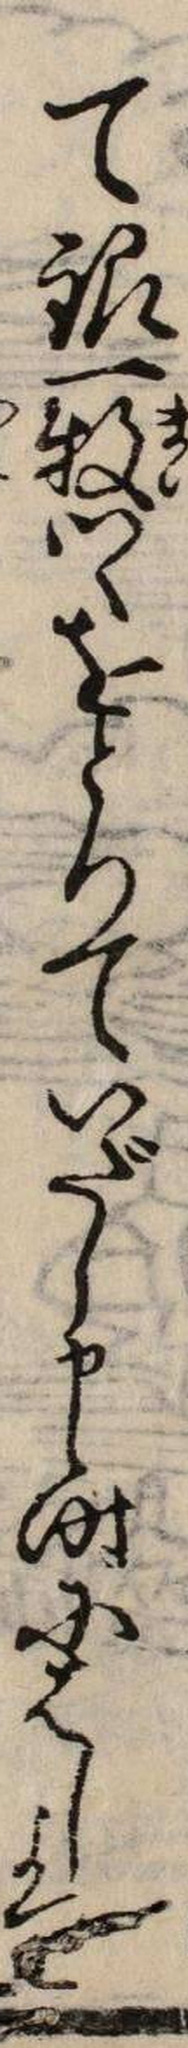て銀一枚つつをとりていだし申候時にはしよ
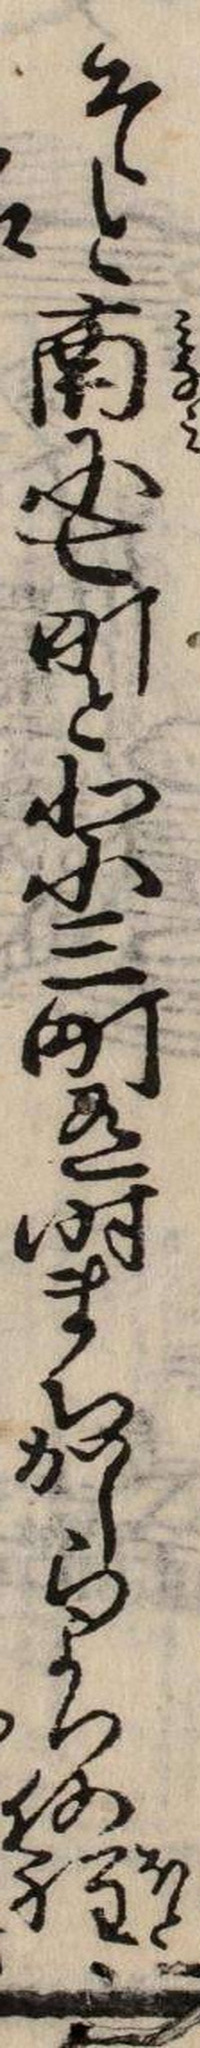そと南に七町と北に三町有時まちかしらより何程と六時
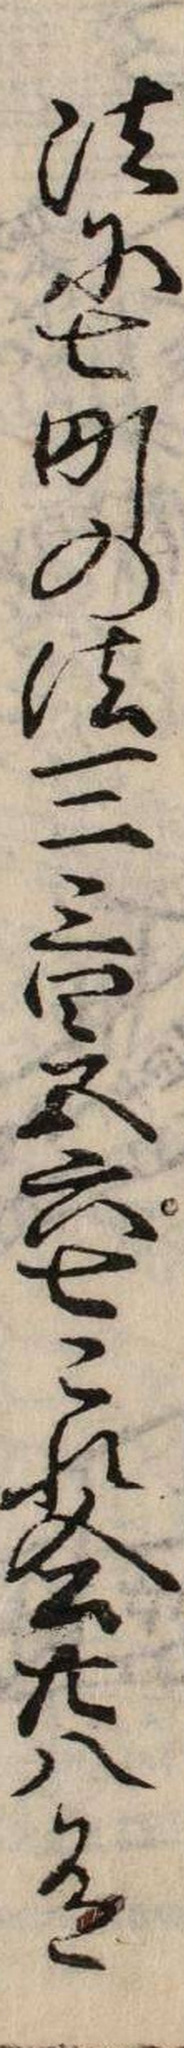法に七町の法一二三四五六七これ合廿八有
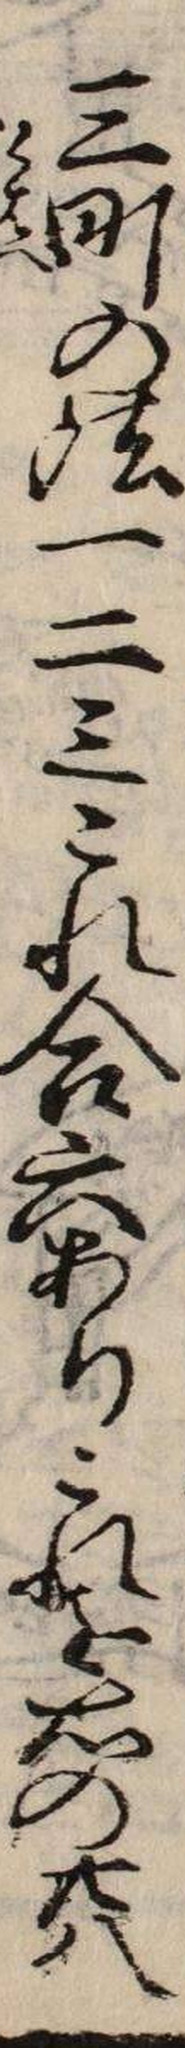三町の法一二三これ合六ありこれを右の廿八
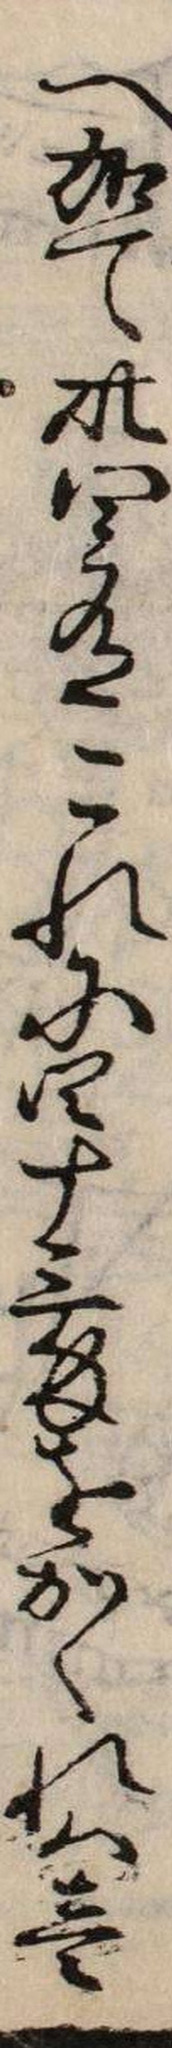へ加て卅四有これに四十三匁をかくれは壱
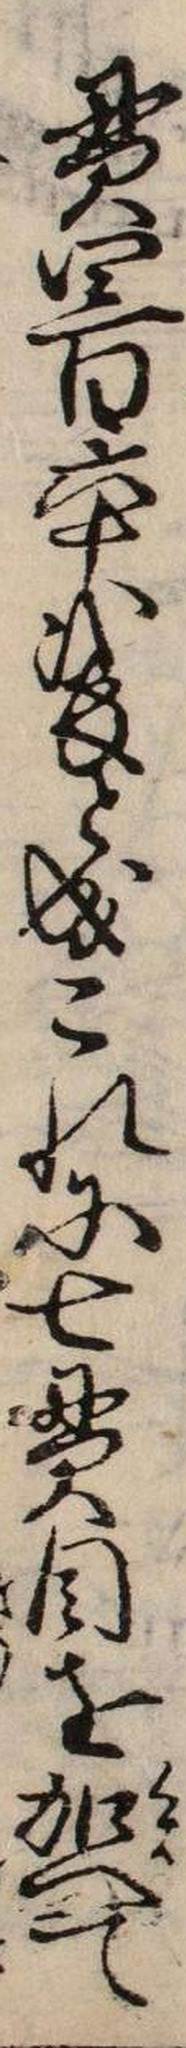貫四百六十弐匁と成これに七貫目を加へて
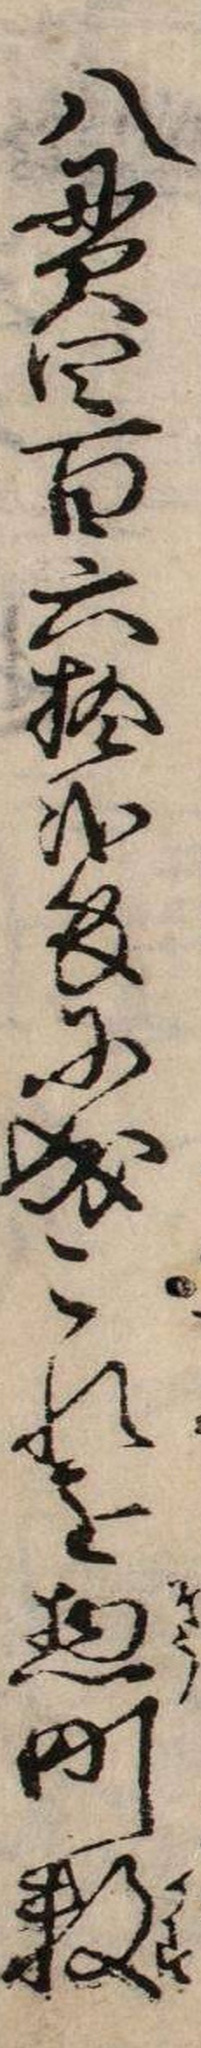八貫四百六拾弐匁に成これを惣町数
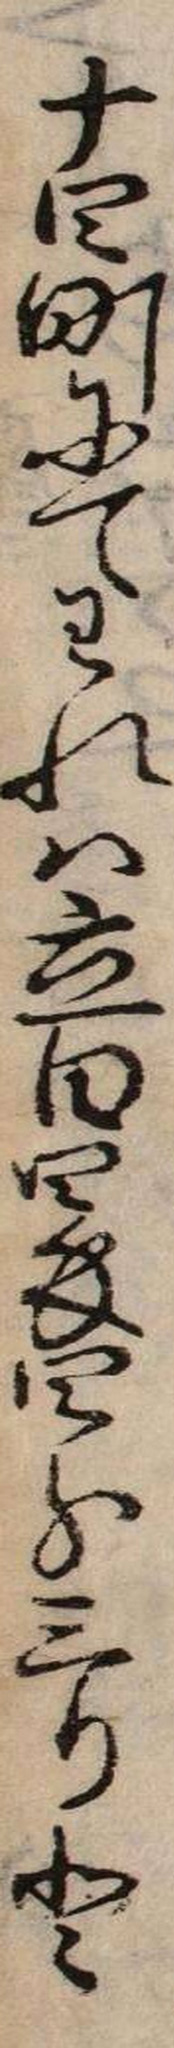十四町にてわれは六百四匁四分三りと

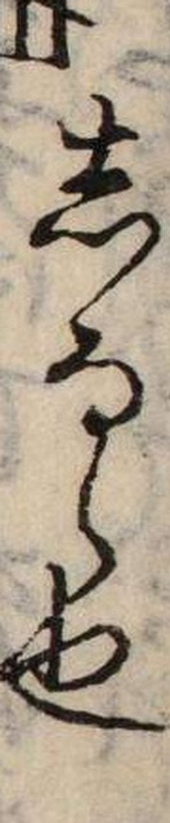しるる也
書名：塵劫記（寛永11年自跋、京都府立京都学・歴彩館追貴8）
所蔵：京都府立京都学・歴彩館 国文学研究資料館
